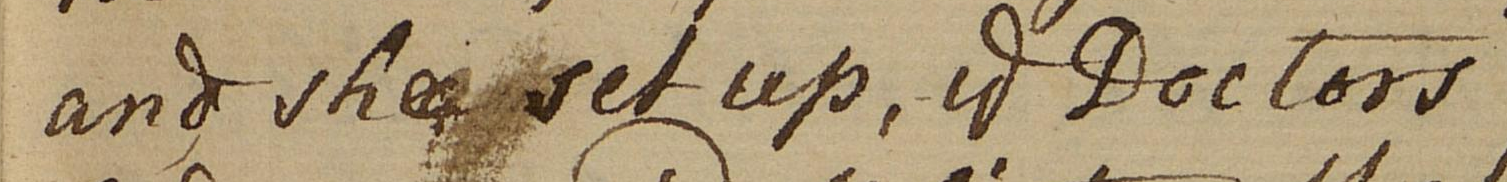and she set up, y^e Doctors
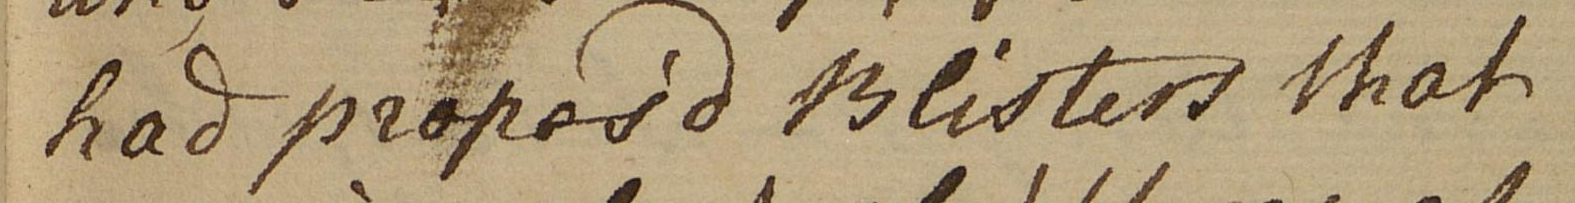had propos'd Blisters that
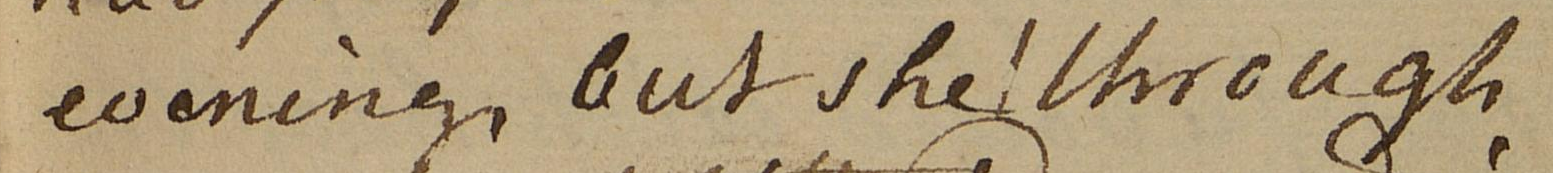evening, but she through
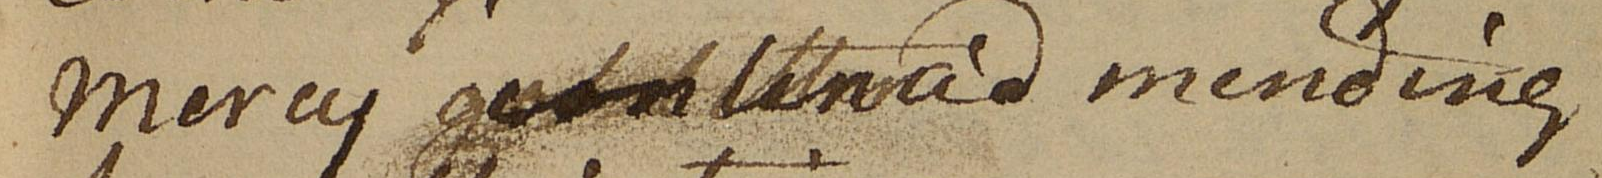mercy continu'd mending
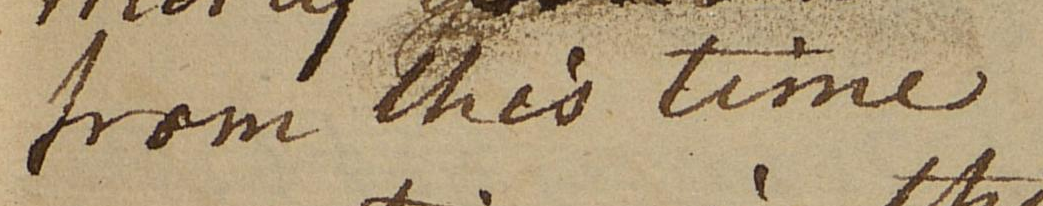from this time
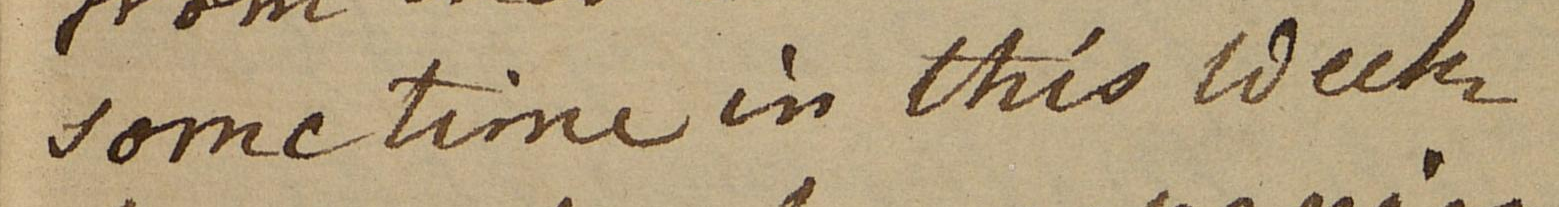some time in this Week
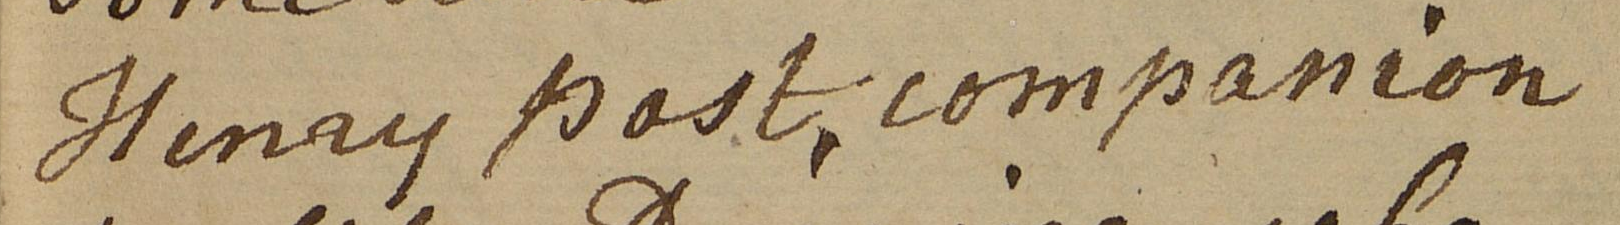Henry Past companion
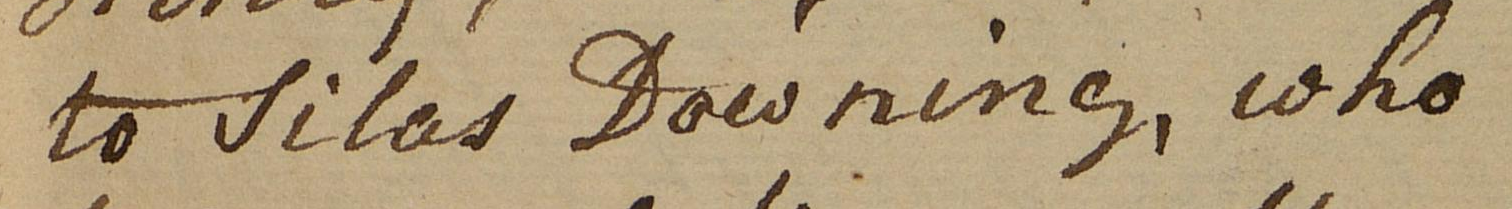to Silas Downing, who
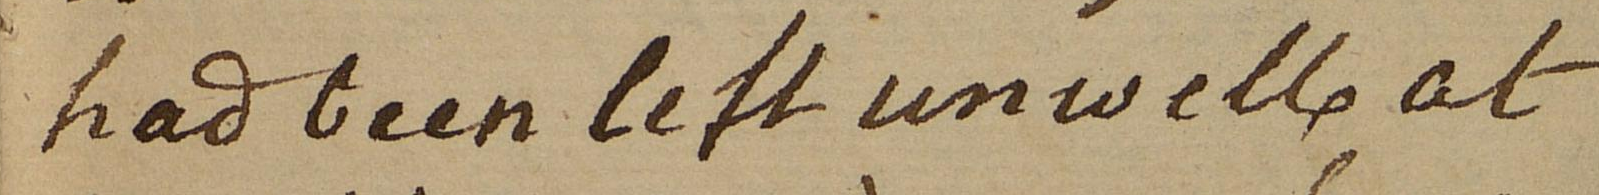had been left unwell at
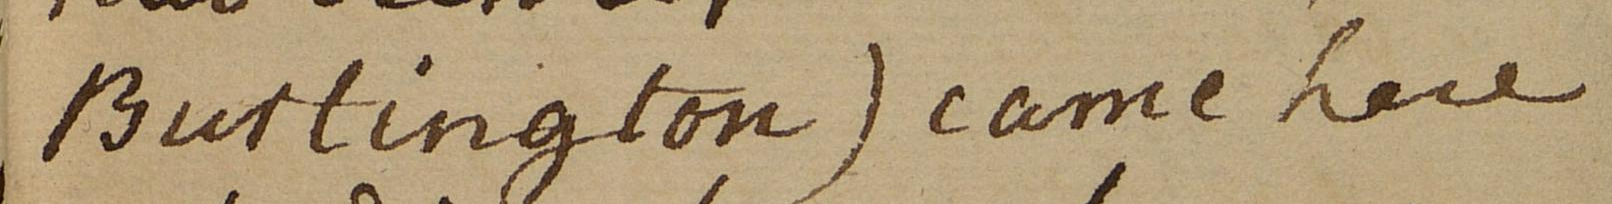Burlington ) came here
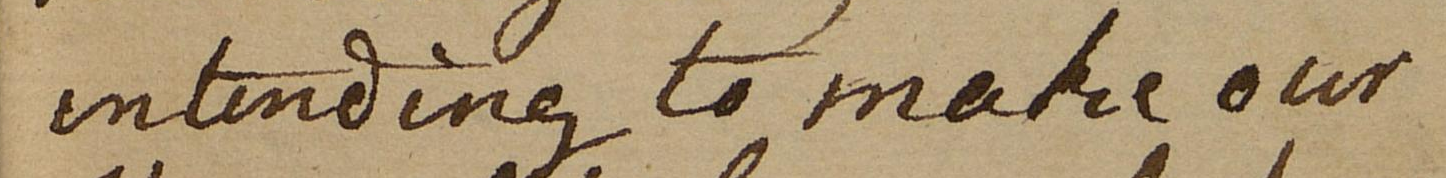intending to make our
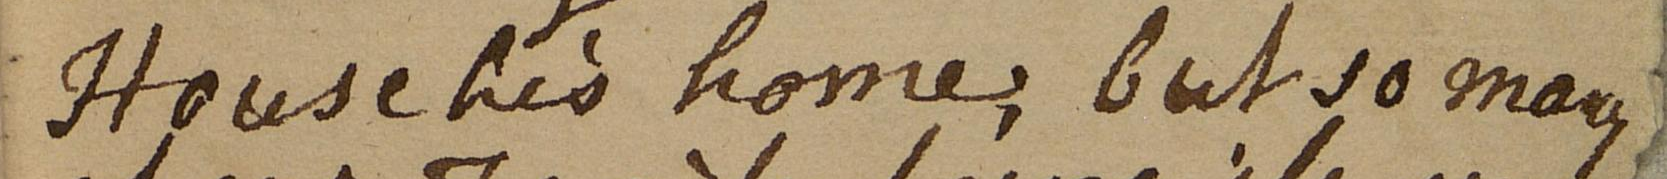House his home, but so many
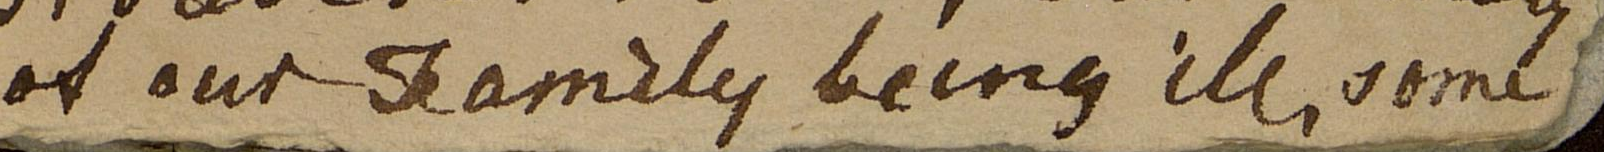of our Family being ill, some
